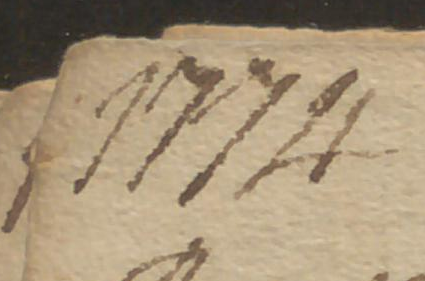1774
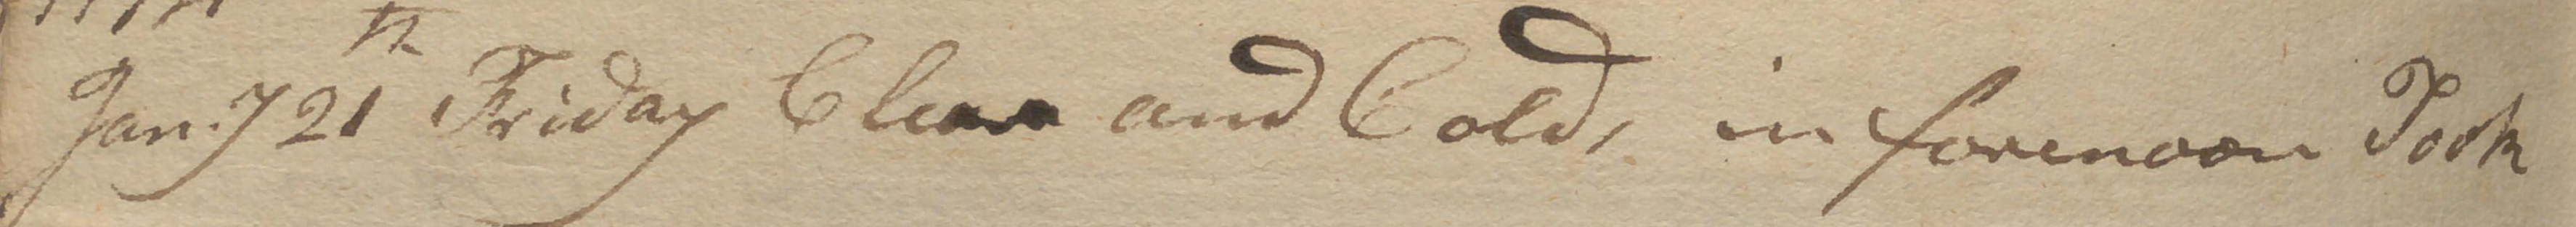Jan^y. 21^th Friday Clear and Cold, in forenoon Took
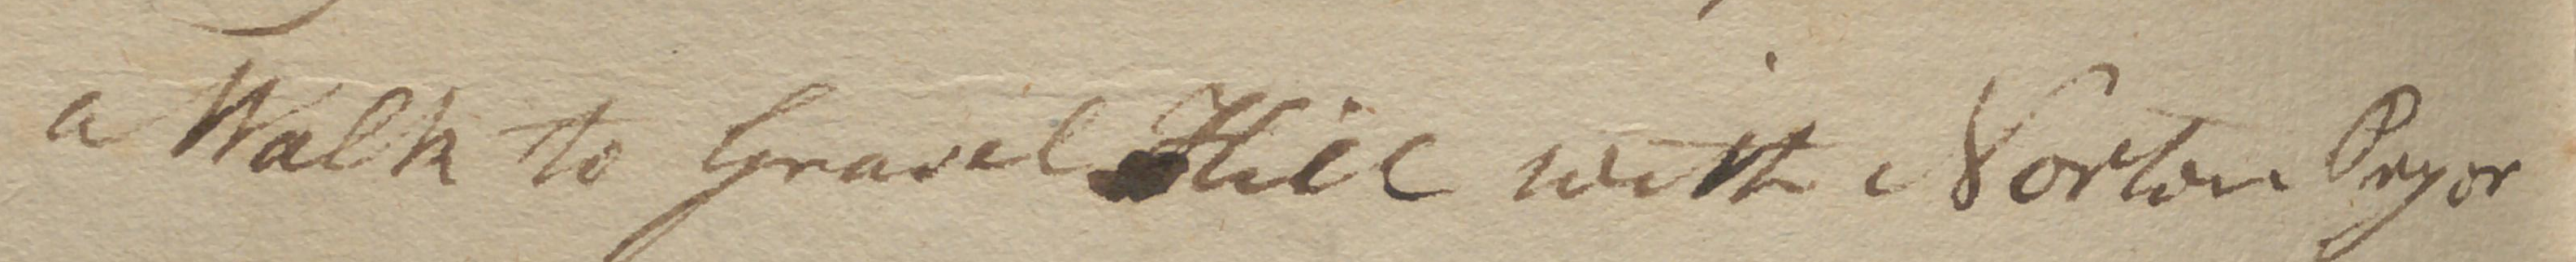a Walk to Gravel Hill with Norton Pryor
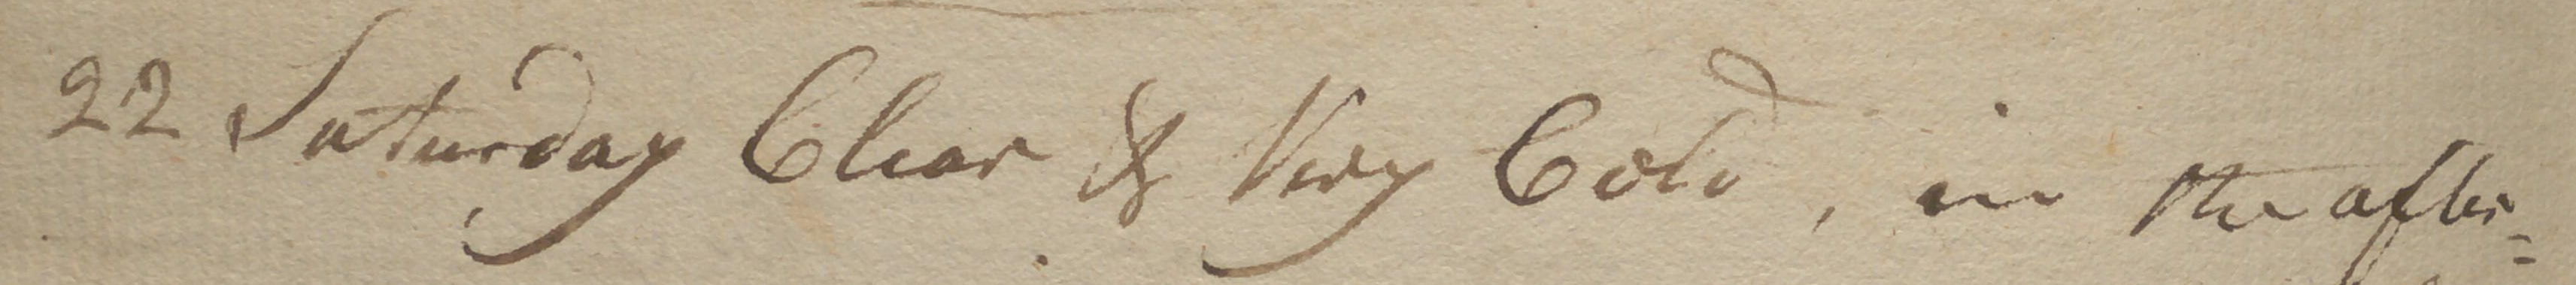22 Saturday Clear & Very Cold, in the after
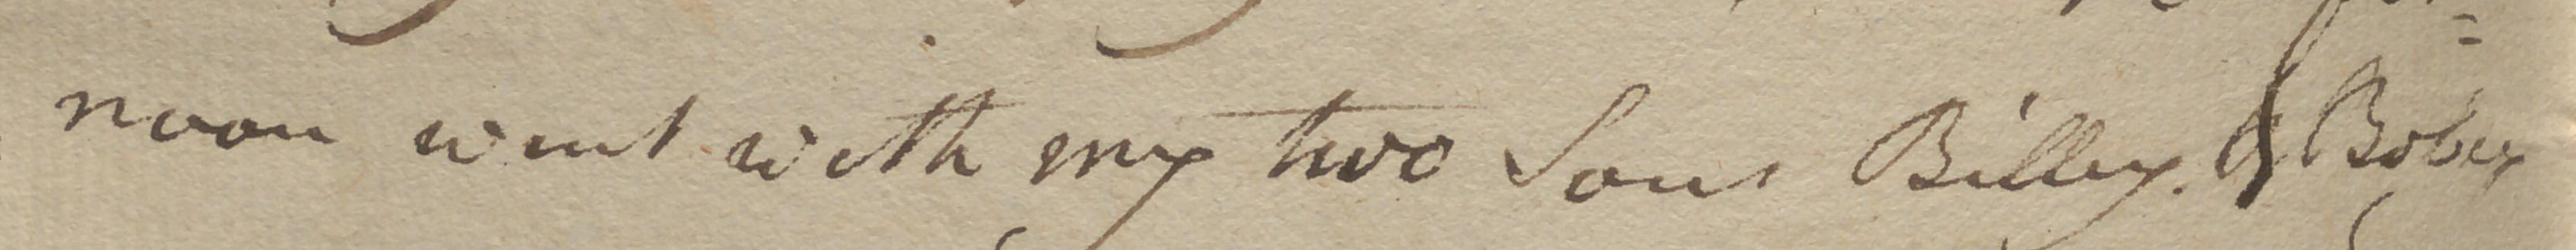noon went with my two Sons Billey & Bobey
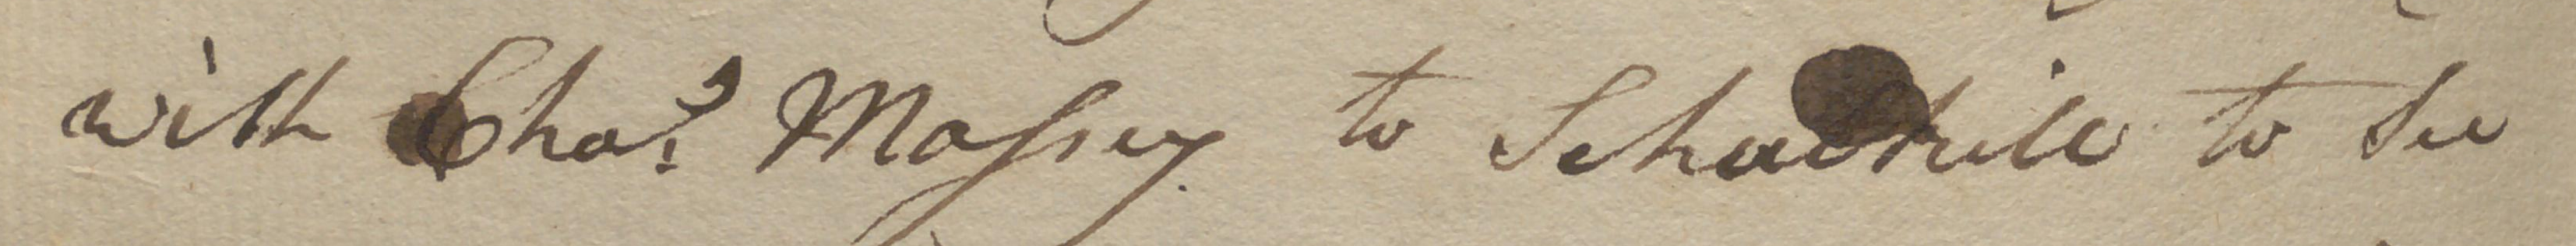with Cha^s. Massey to Schulkill to see
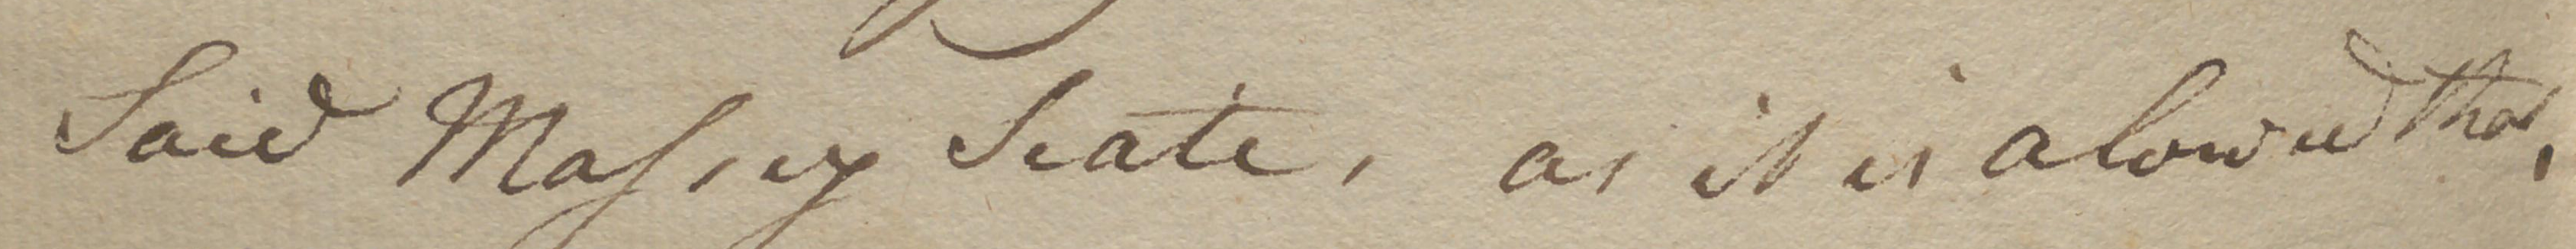Said Massey Scate, as it is alowed that
